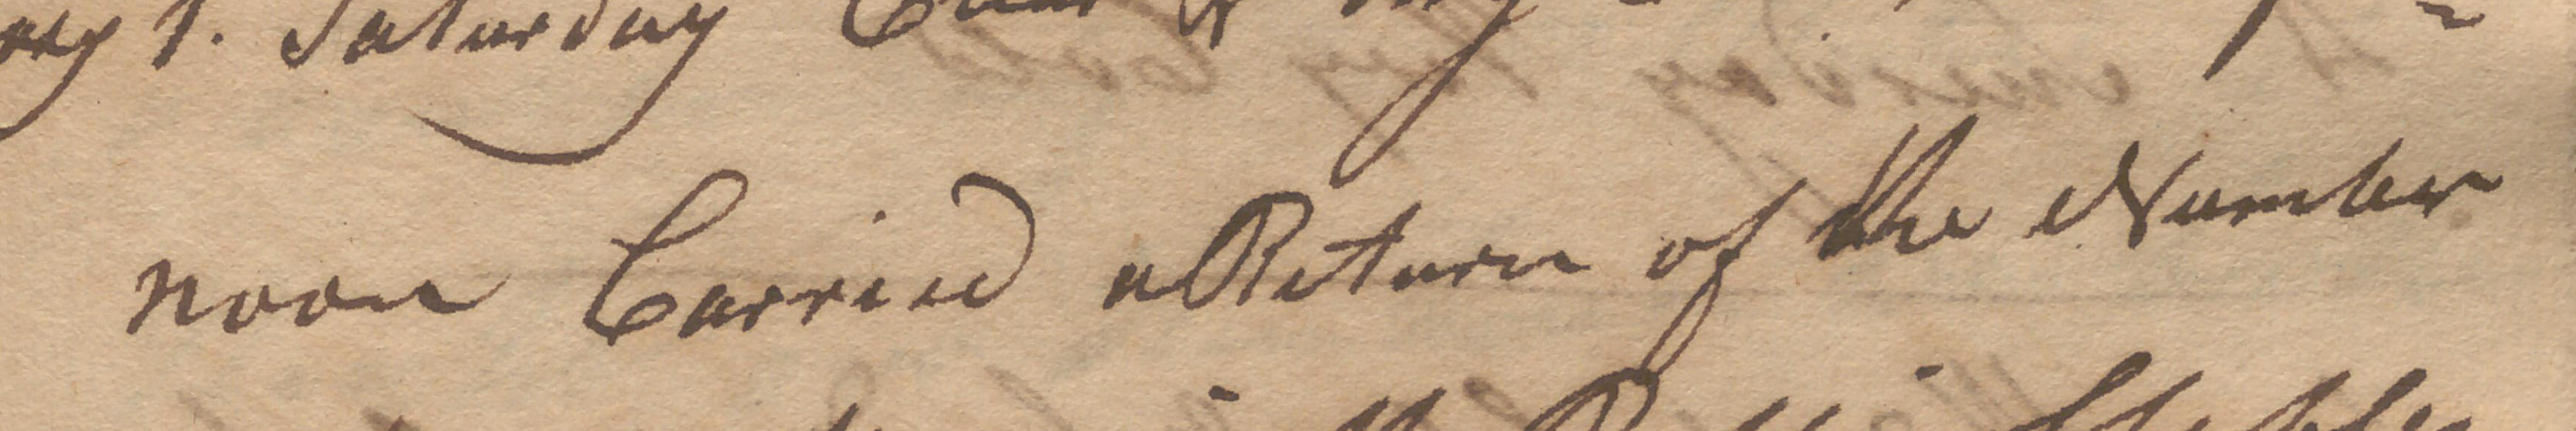nover Carried a Return of the Number
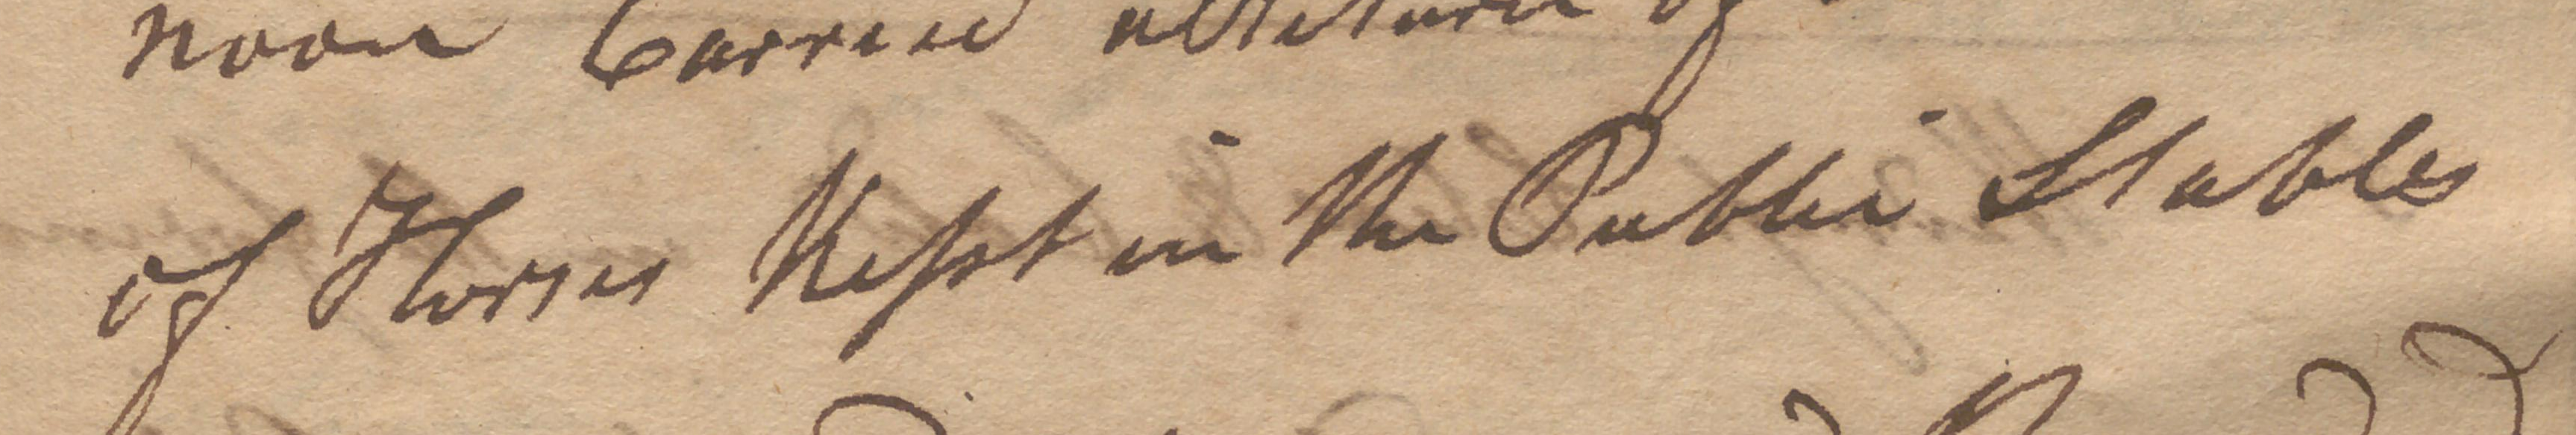of Horses kept in the Public Stable
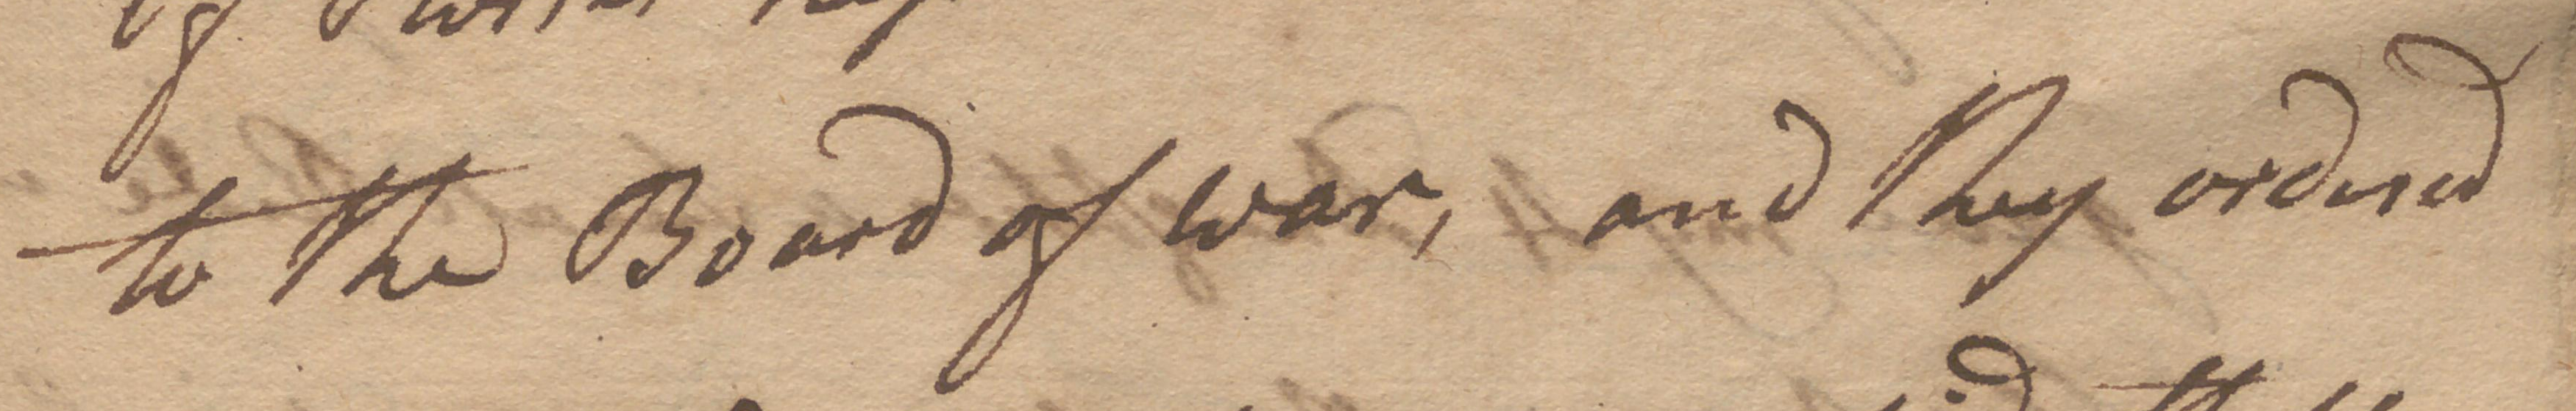to the Board of war, and they ordered
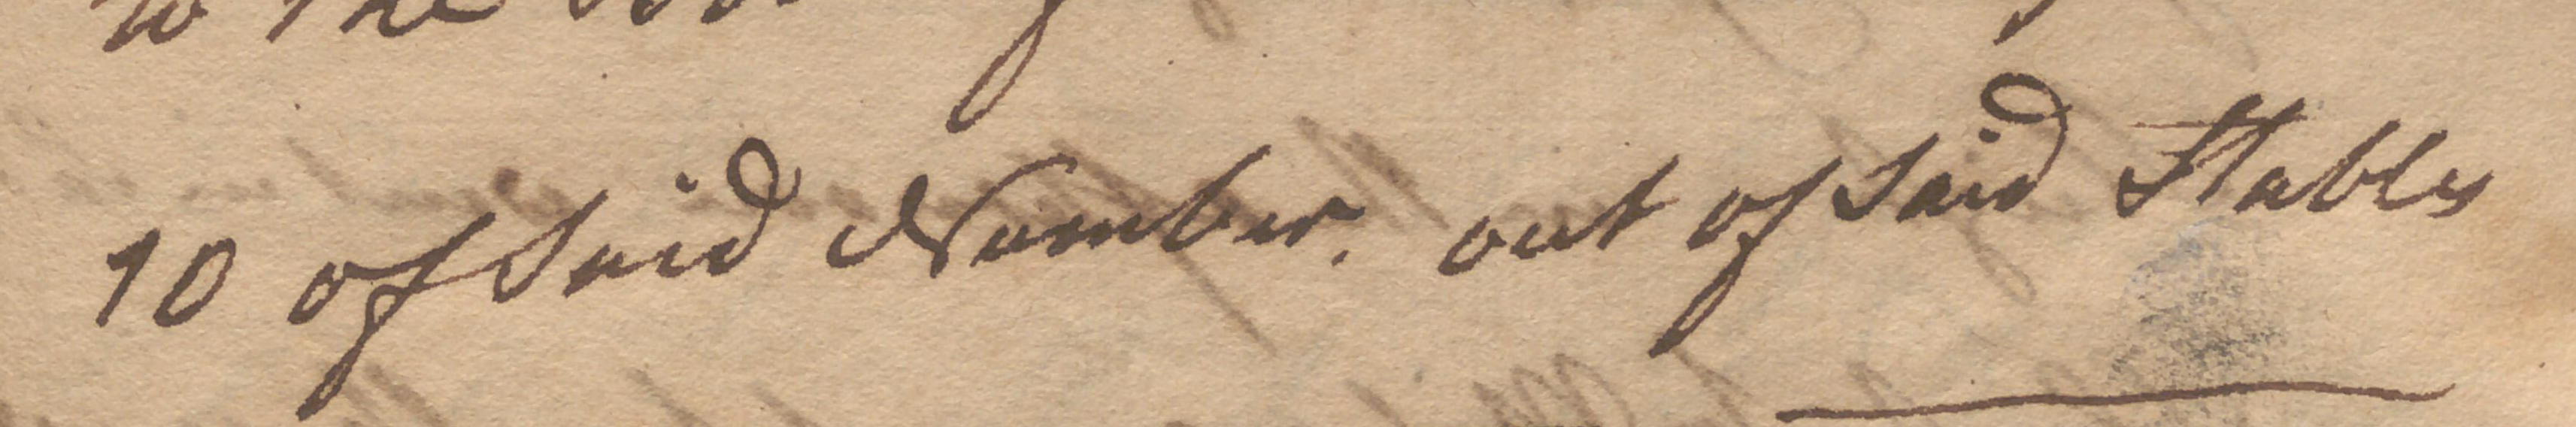10 of said Number. out of said Stables
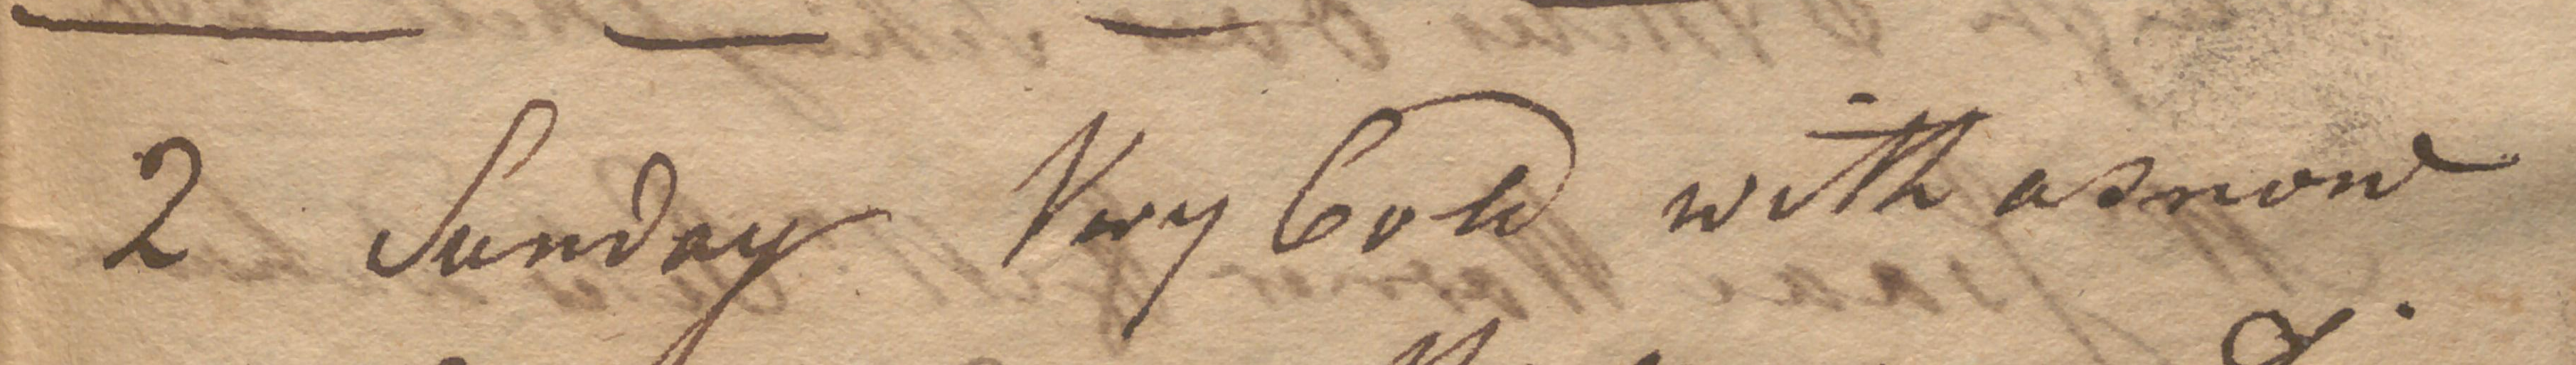2 Sunday Very Cold with a snow
